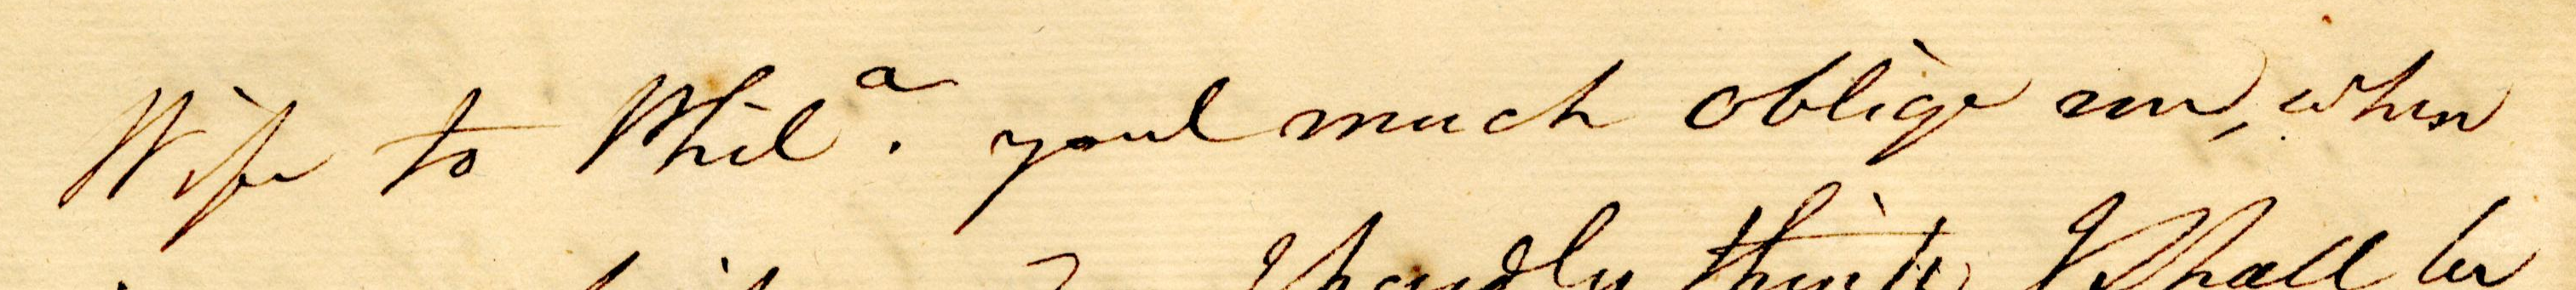Wife to Phil^a. youl much oblige me, when
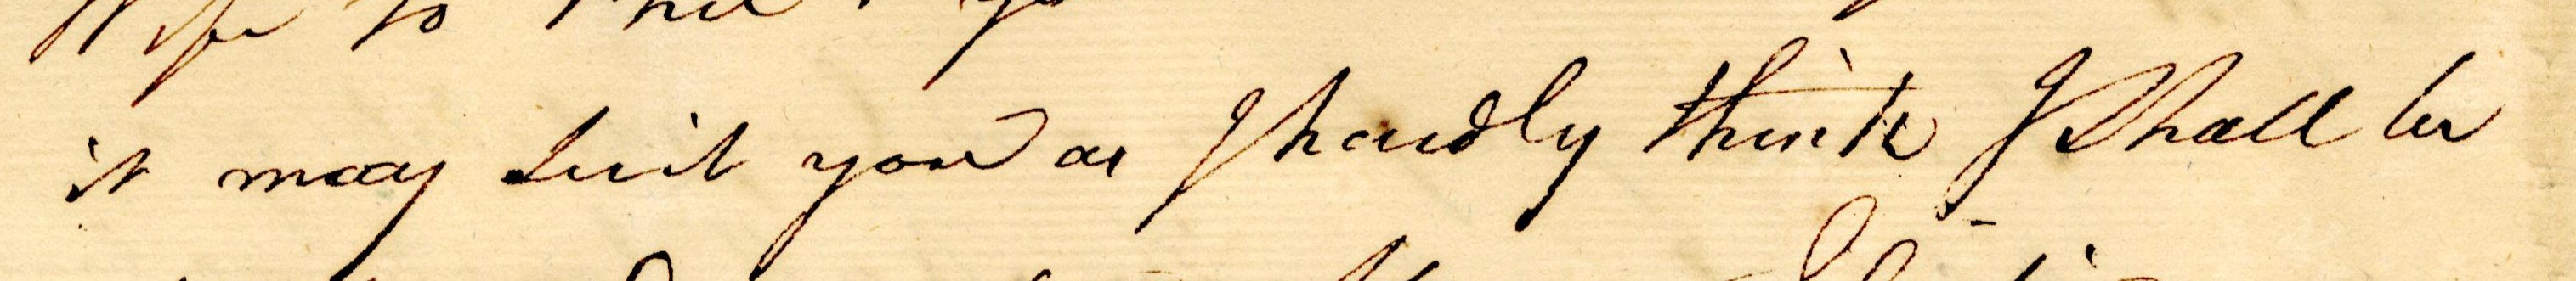it may suit you as I hardly think I shall be
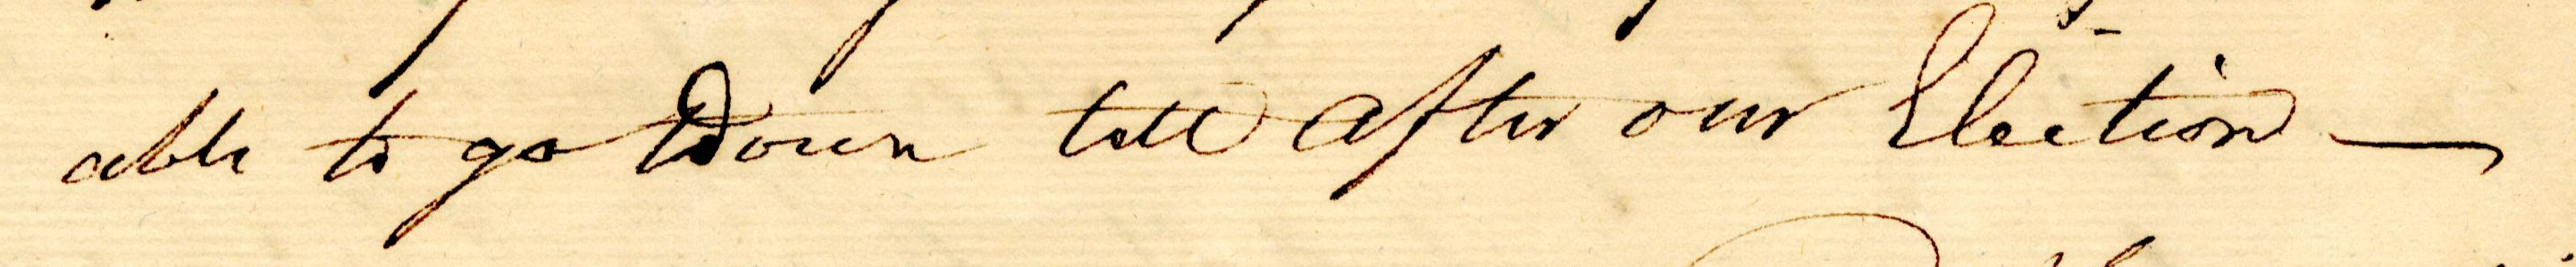able to go Down till after our Elections-
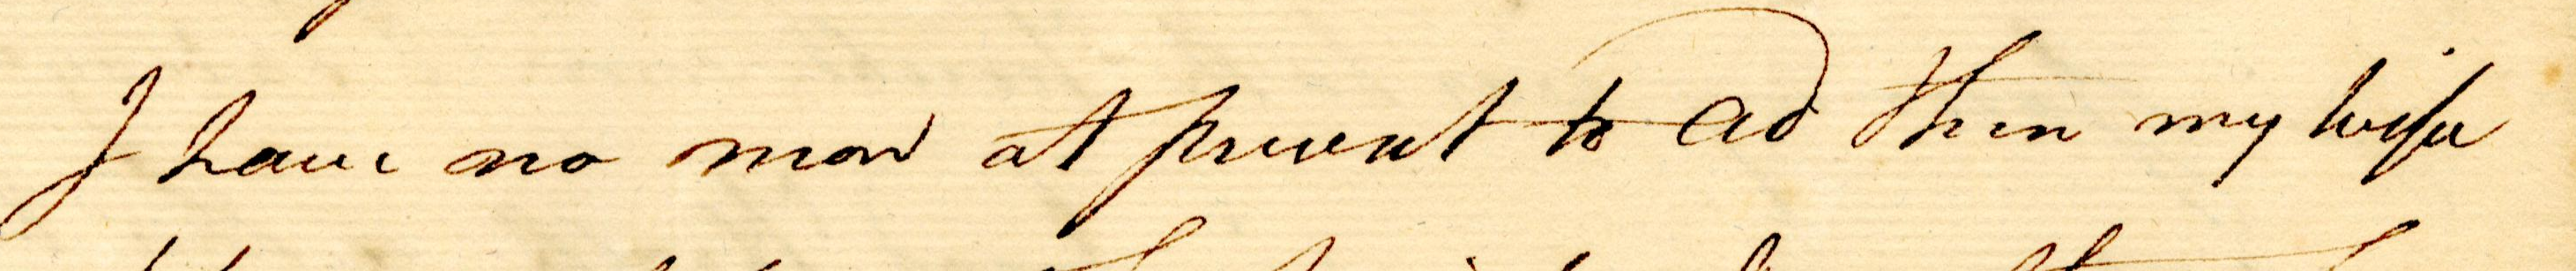I have no more at present to ad then my wife
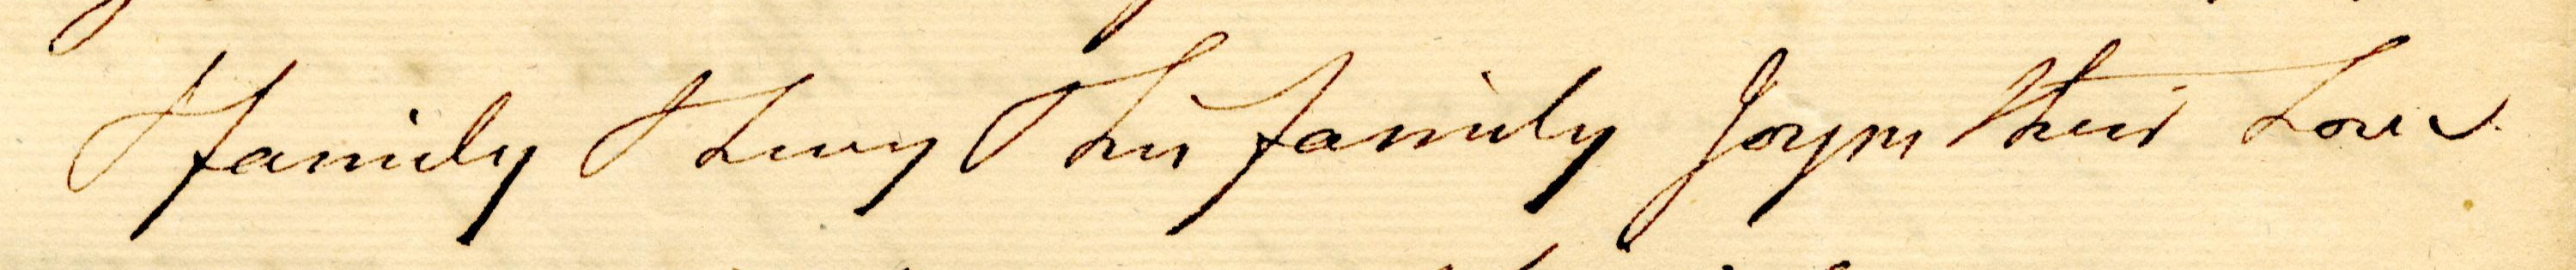& family & Levy & his Family Joyns their love
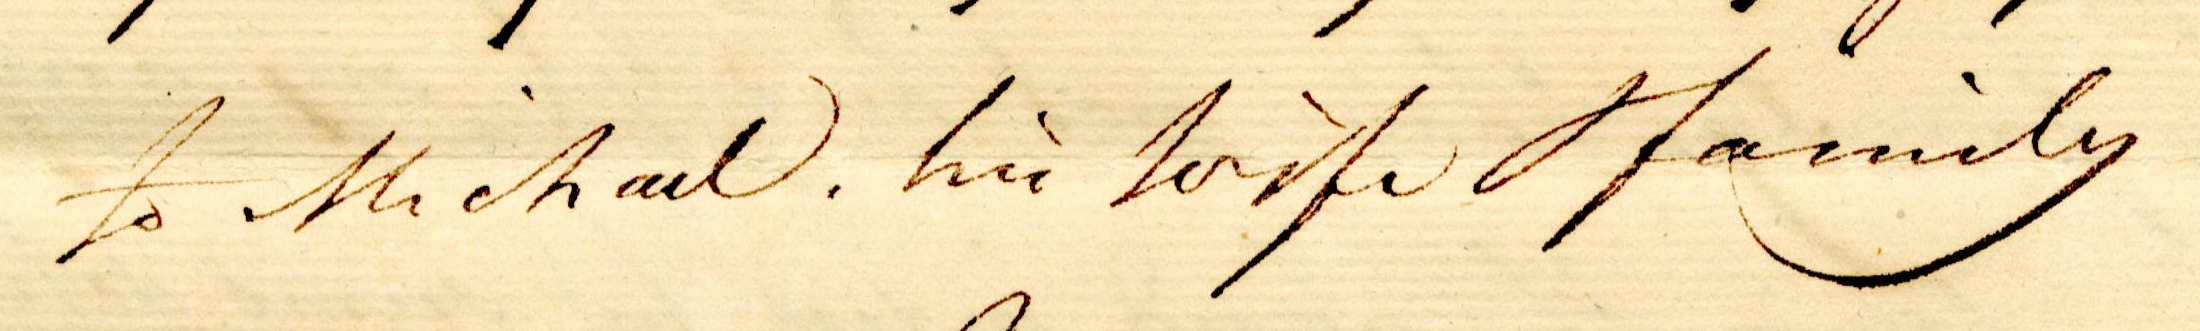to Michael, his wife & family
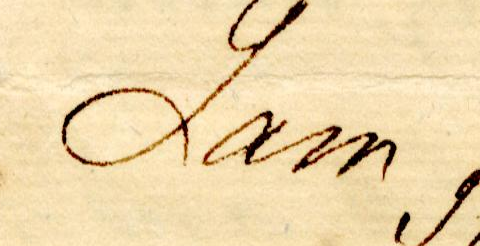I am
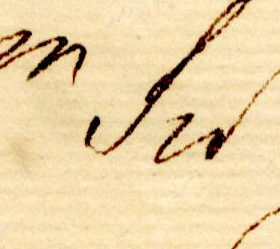Sir
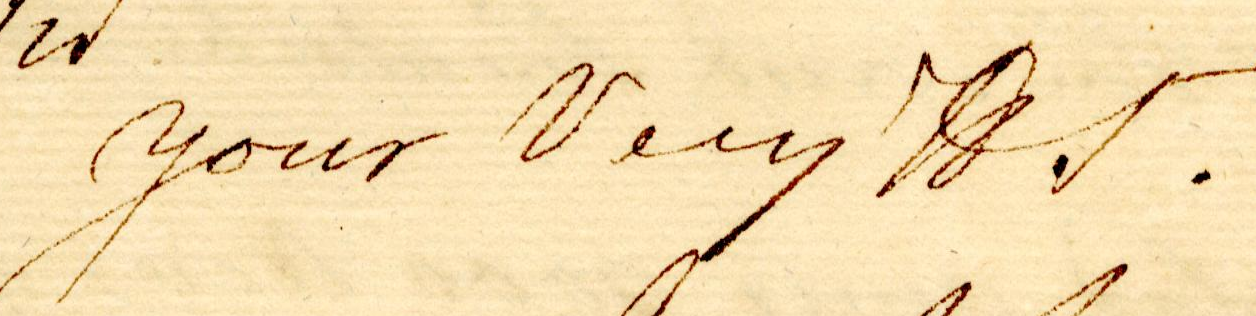Your very H S^t.
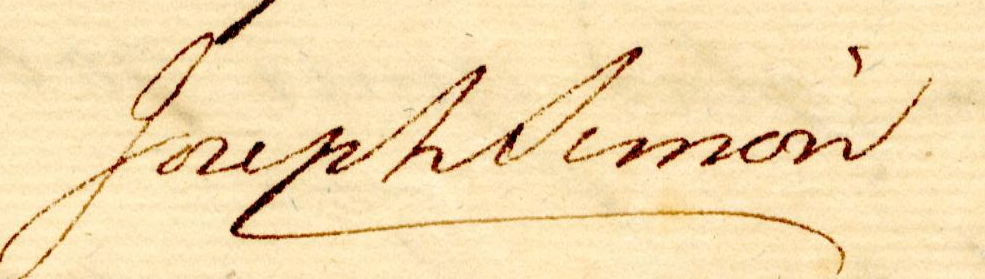Joseph Simon
